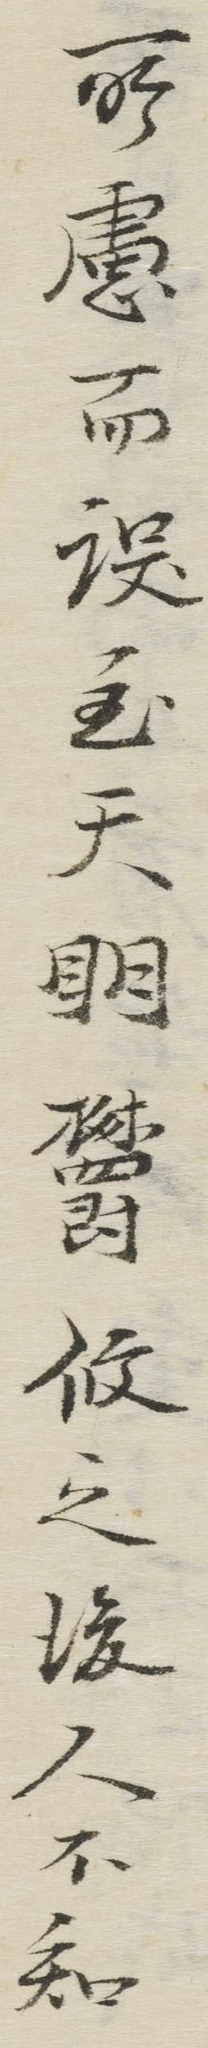所慮而誤至天眀鬱修攸之後人不知
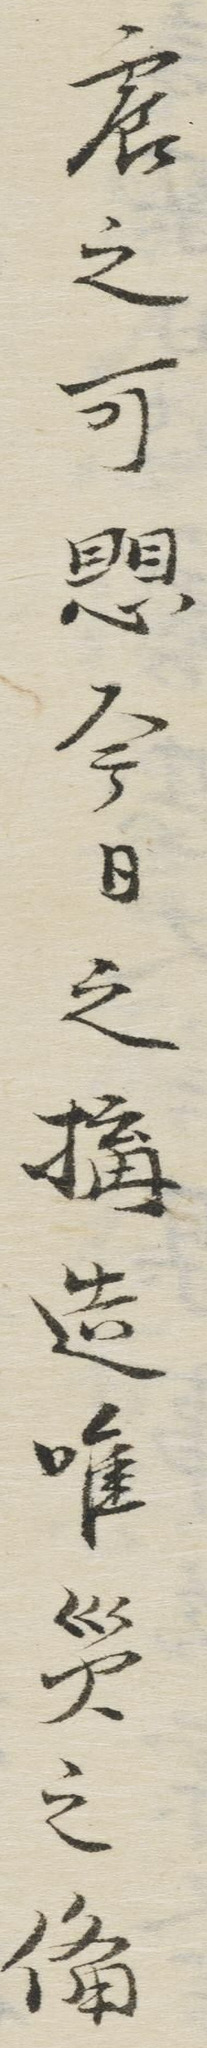震之可思今日の構造唯災之備
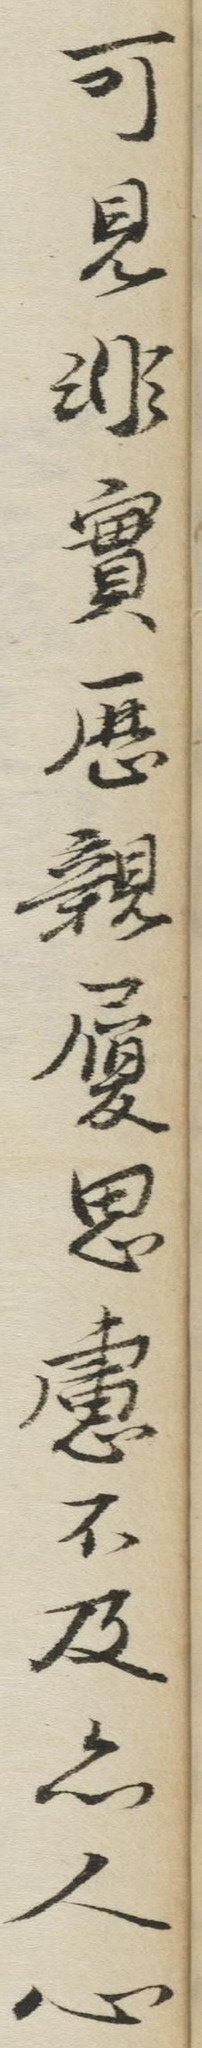可見非日歴親婦履思慮不及亦人心
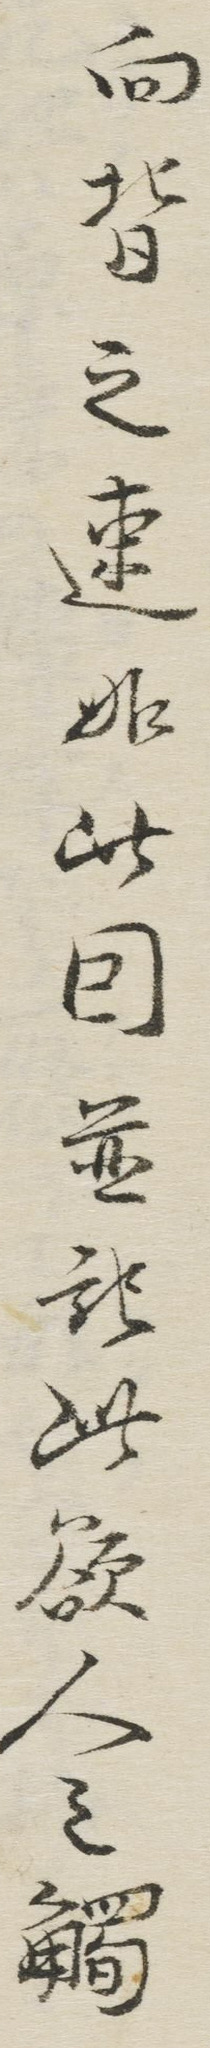向背の速如此因並記此欲人之触
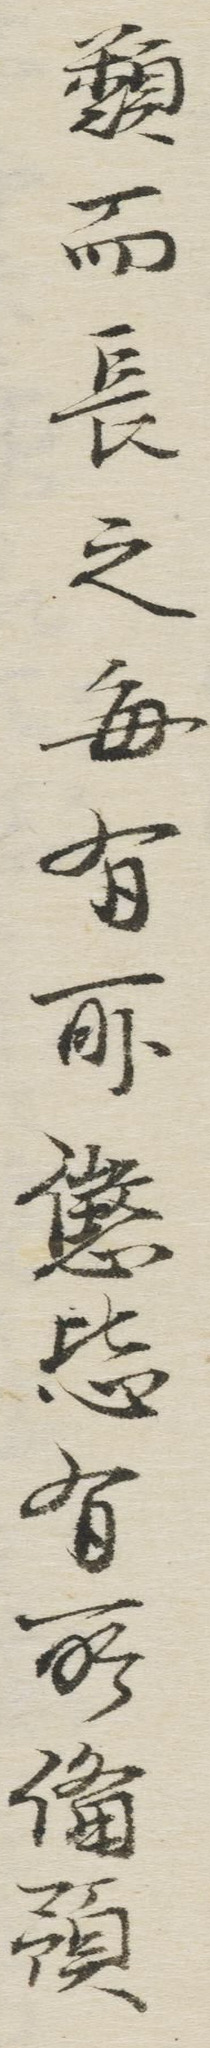類而長之毎有所懲毖有所備預
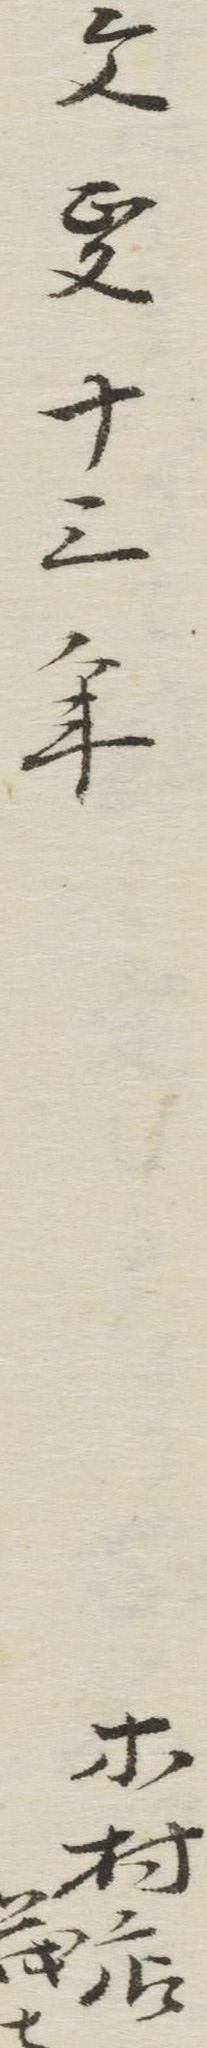文政十三年木村店
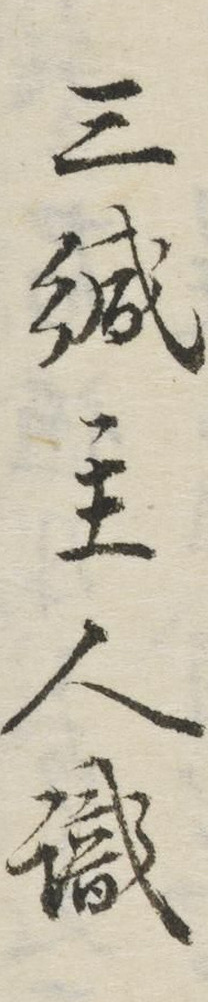三緘主人識
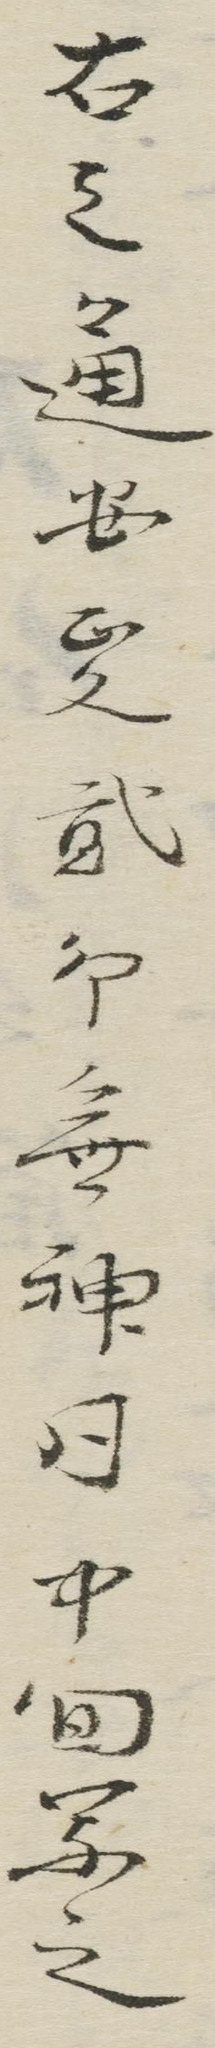右之通安政弐卯無神月中旬

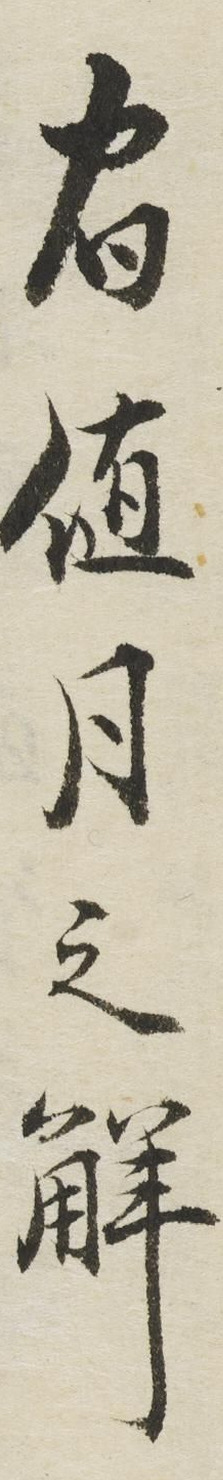宿値月之解
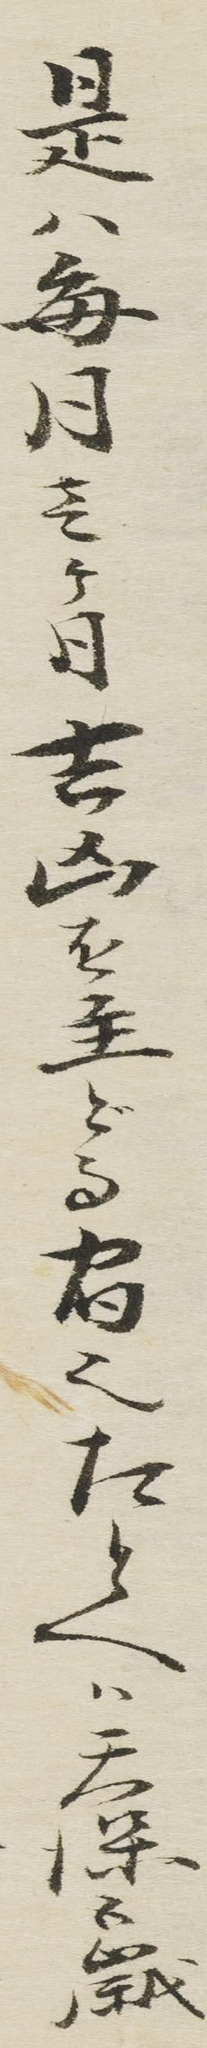是ハ毎月壱ヶ月吉凶を主どる宿也たとへハ天保五歳
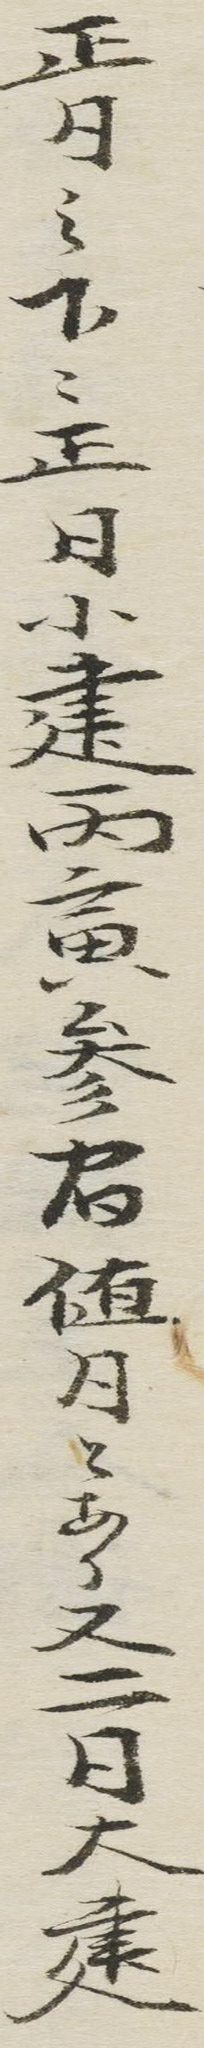正月之下二正月小建丙寅参宿値月とあり又二月大建
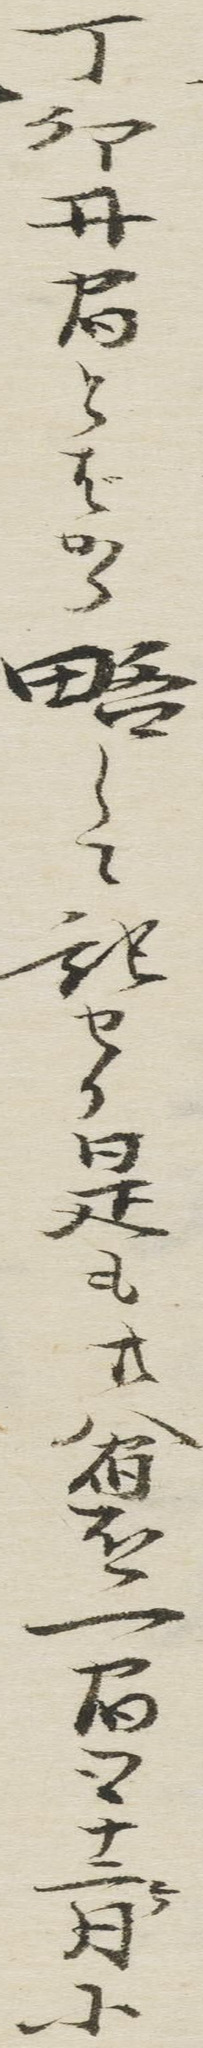丁卯井宿とばかり略して記せり是も廿八宿を一宿ツゝ十二ヶ月に
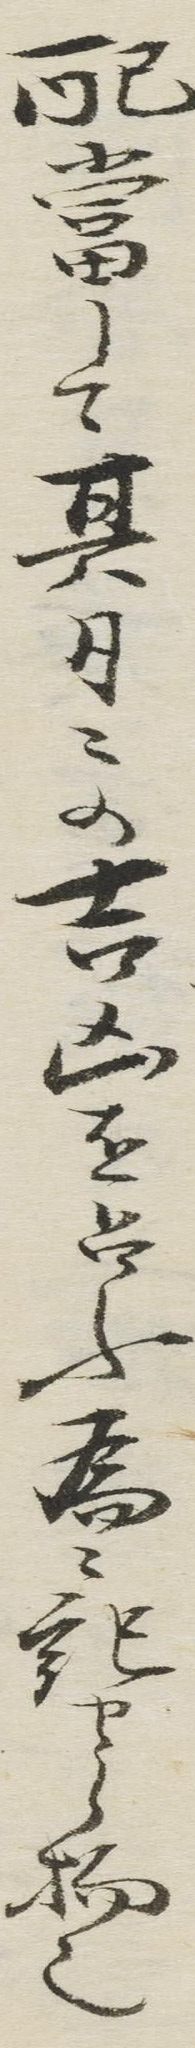配当して其月々の吉凶を占ふ為二記せし物也
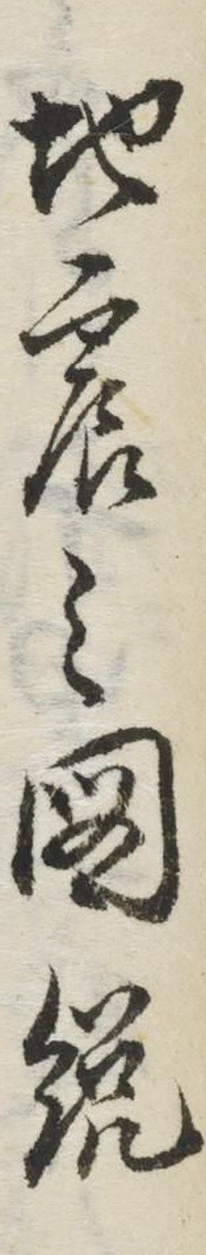地震之図説
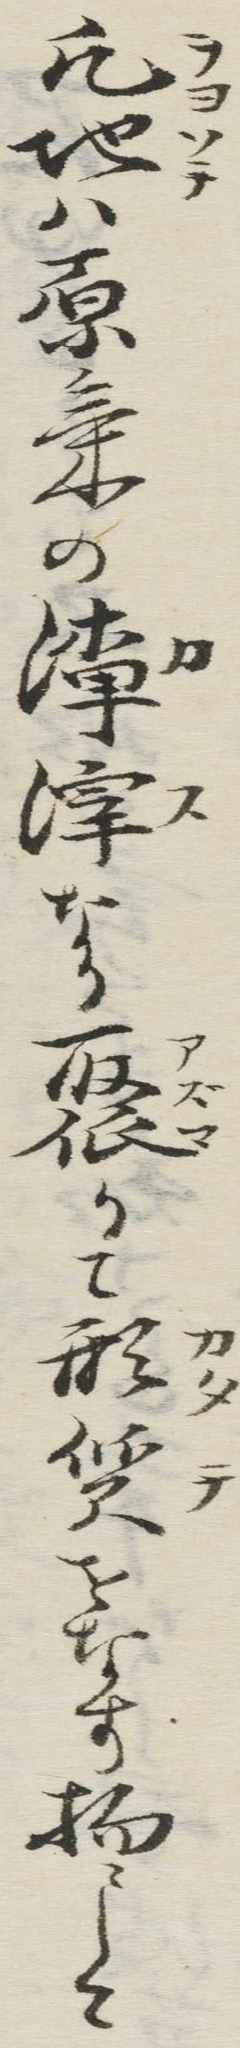凡地ハ原気の渣滓なり聚りて形質をなす物ニして
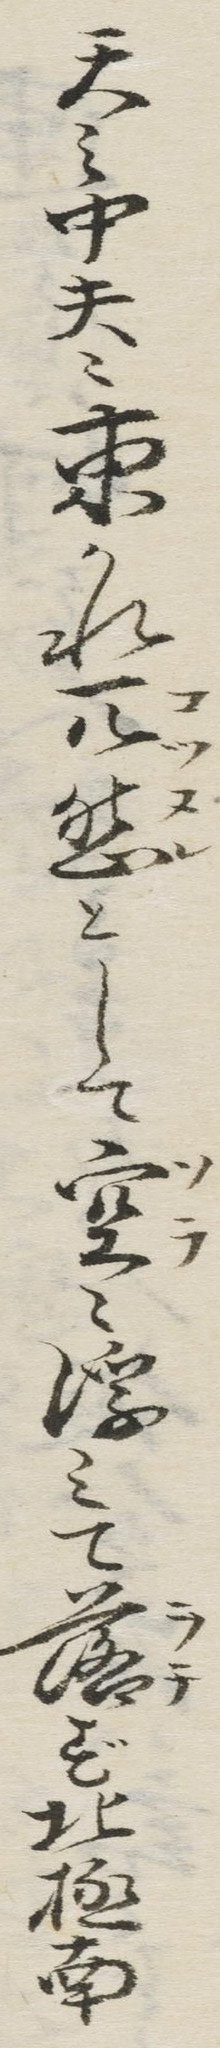天の中夫ニ束かれ兀然として空ニ浮ミて落ず北極南
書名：諸国大地震大津波一代記
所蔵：東京大学地震研究所図書室 Earthquake Research Institute Library, The University of Tokyo, JAPAN
